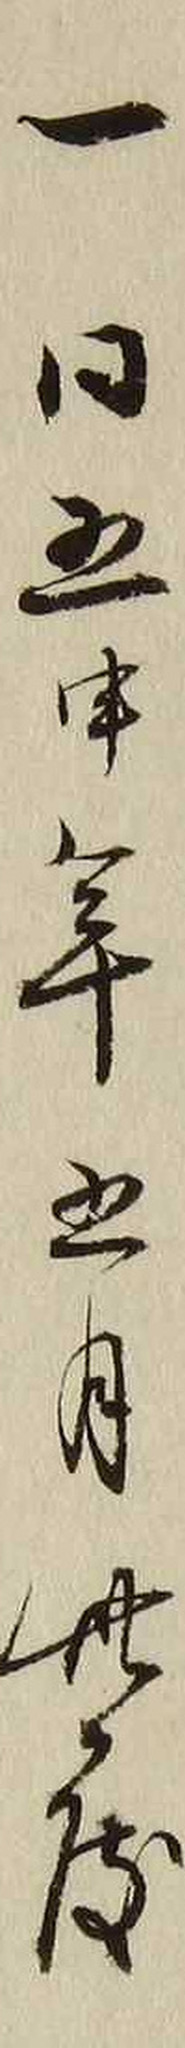一同五申年五月此度
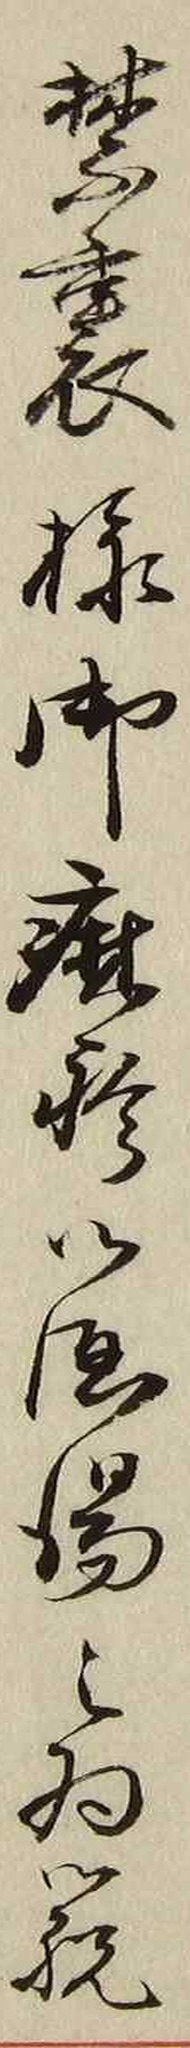禁裏様御麻疹御治湯之為御祝
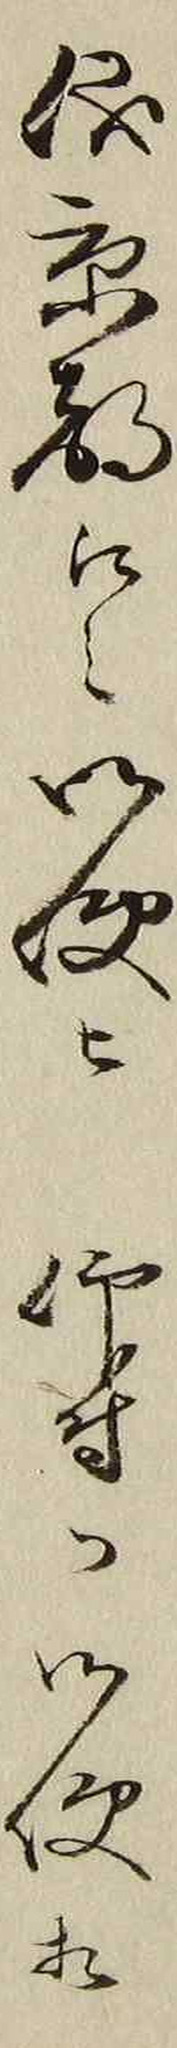儀京都江之御使被仰付候御使相
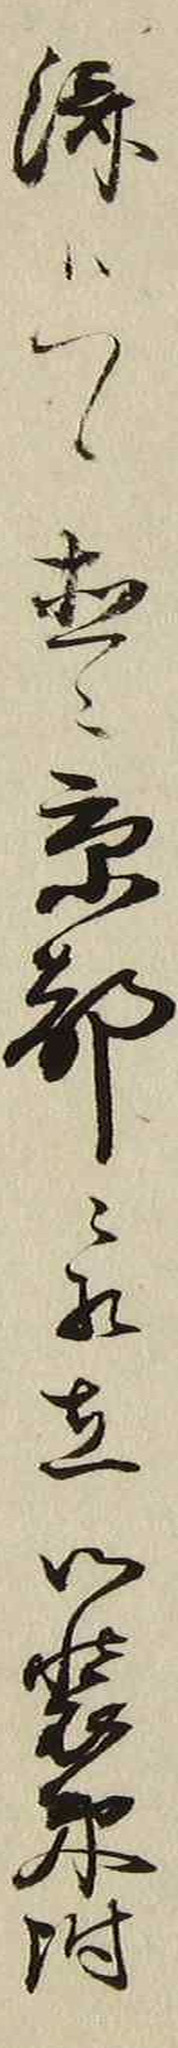済候はゝ直々京都に罷在御装束附
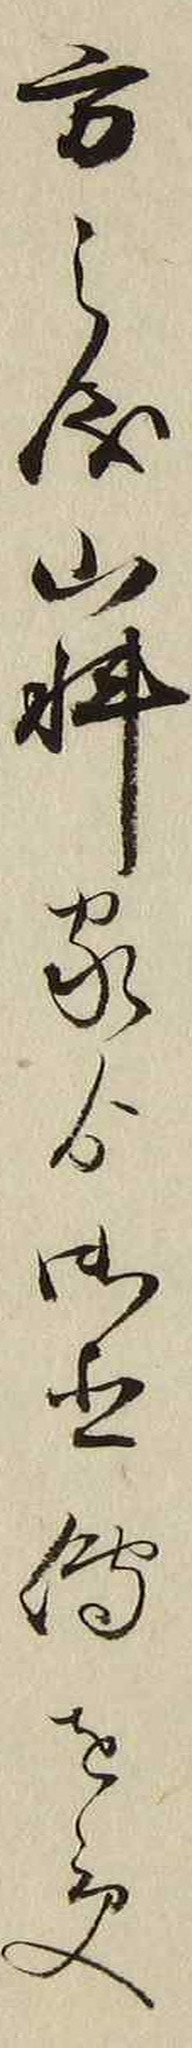方之儀山科家ゟ御直伝を受
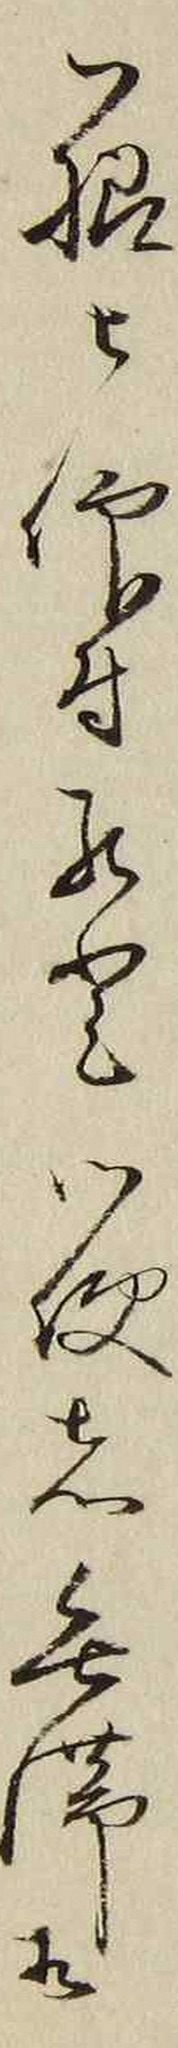候様被仰付罷登御使者無滞相
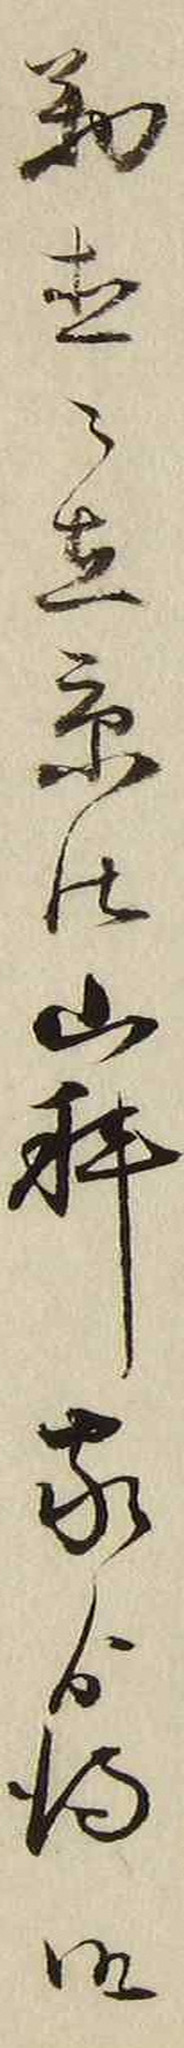勤直々在京仕山科家ゟ得御
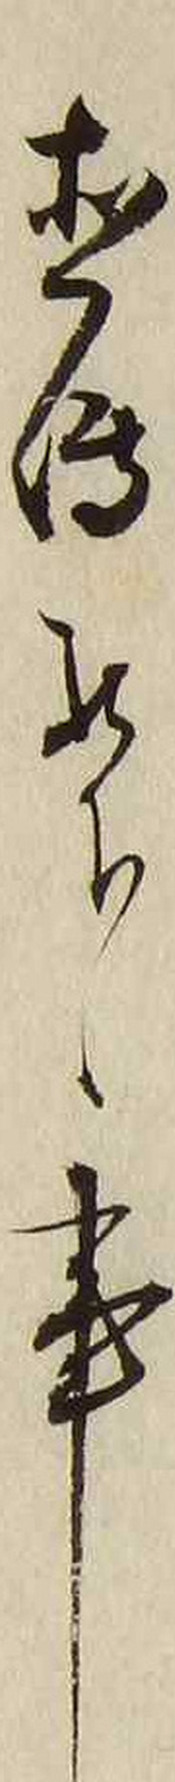直伝罷下候事

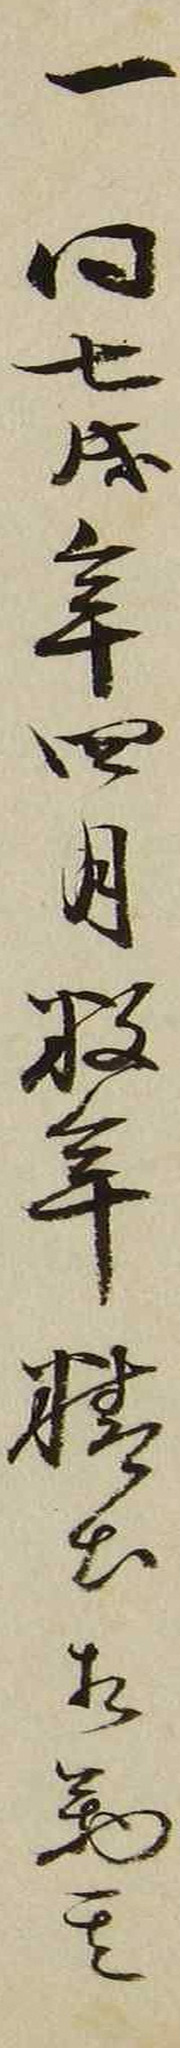一同七戌年四月枚年精出相勤其
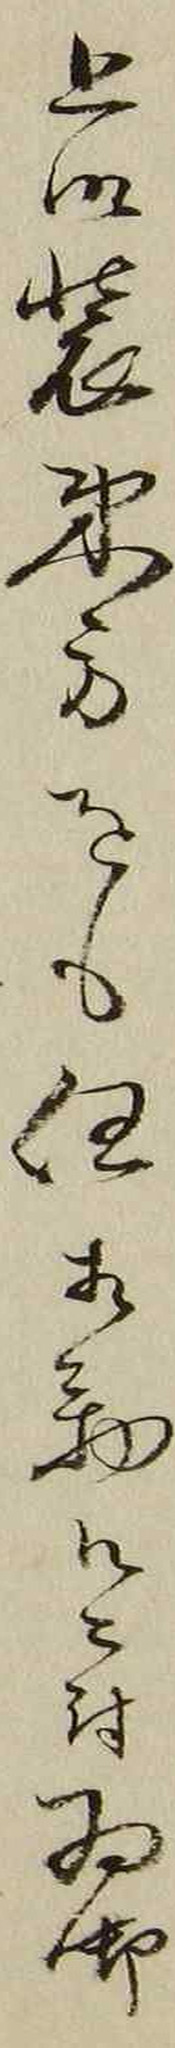上御装束方をも任相勤候に付為御
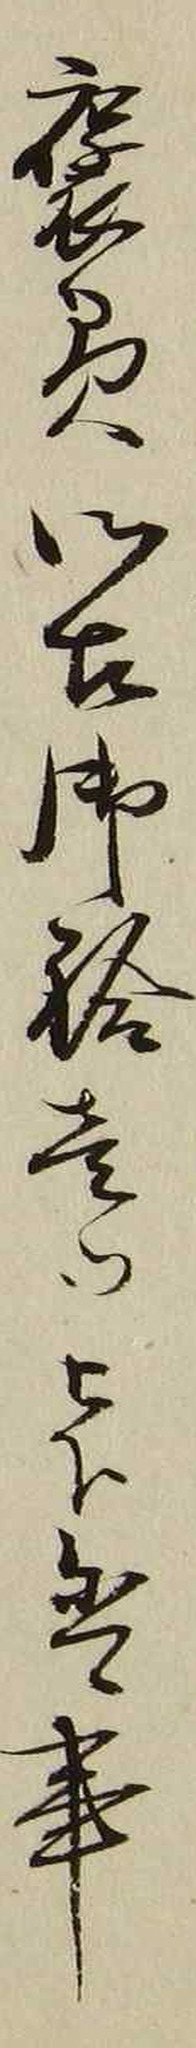御褒美御古御袷壱つ被下置候事
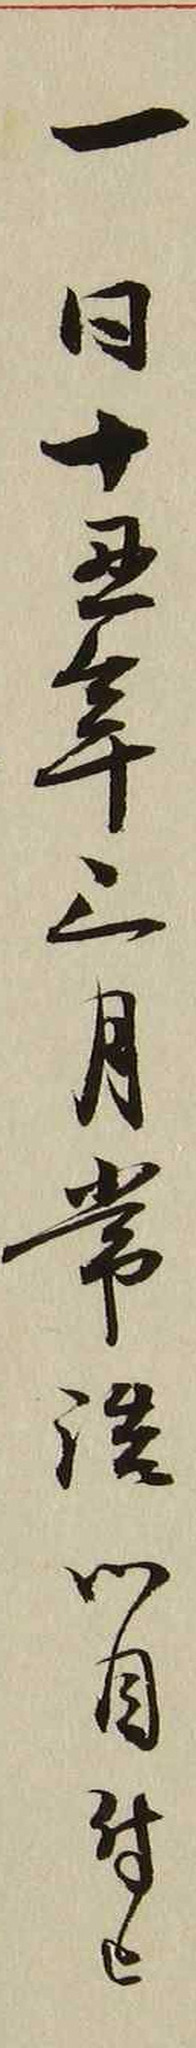一同十右四年三月常詰御目付被
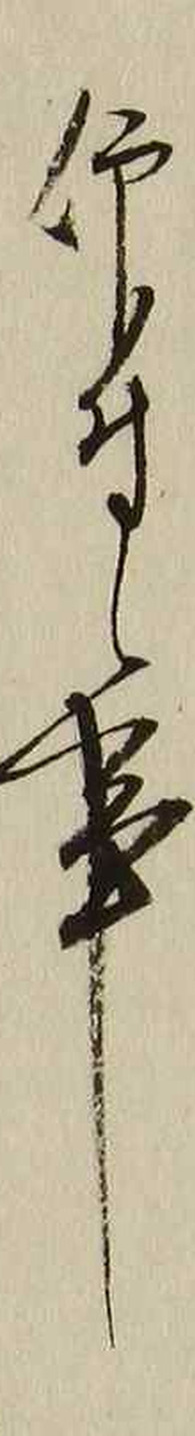仰付候事
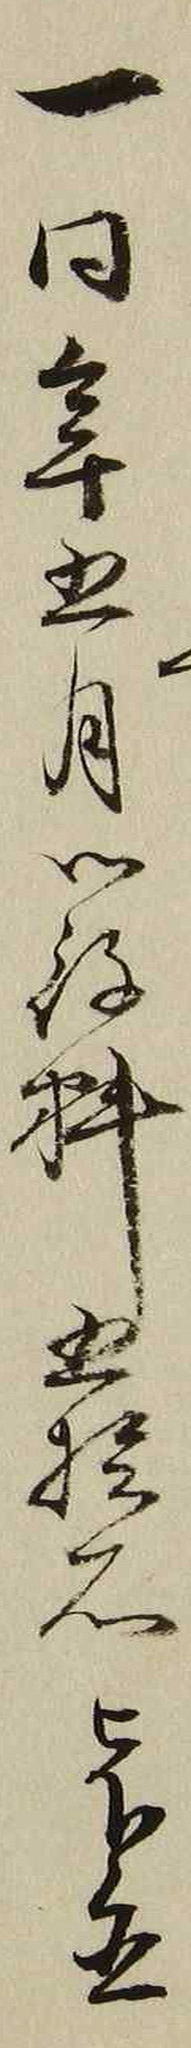一同年五月御役料五拾石被下置
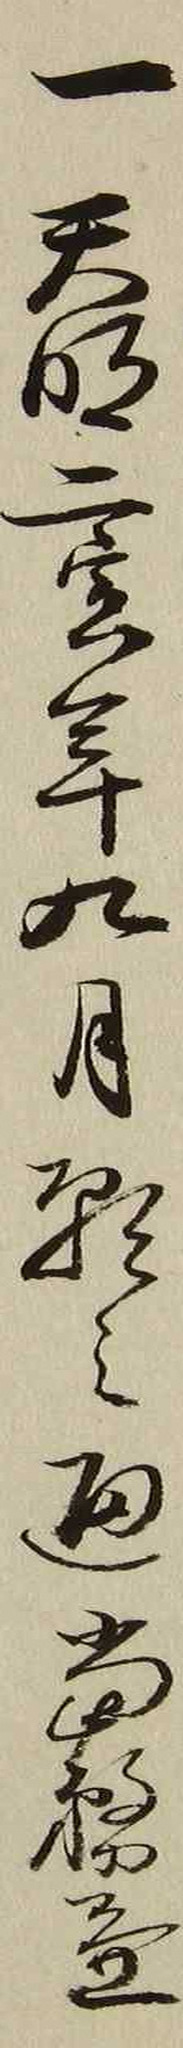一天明二寅年九月願之通当務兼
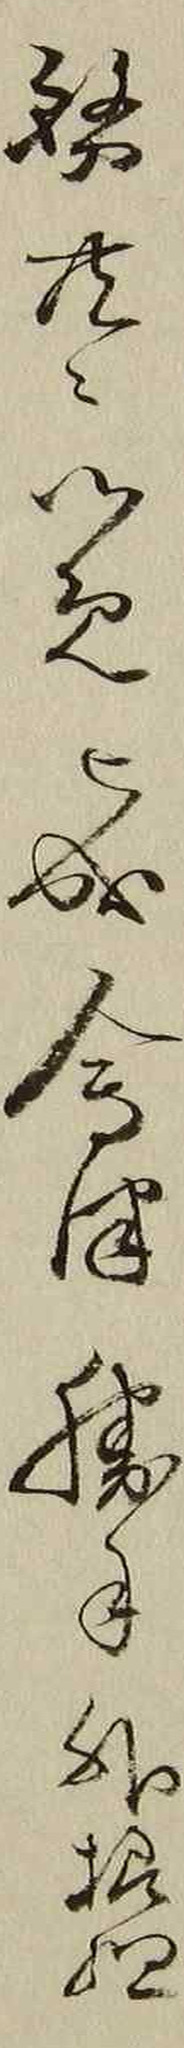務共に御免被成会津勝手外様組
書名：諸士系譜　巻之292　き之部1
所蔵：会津若松市立会津図書館
